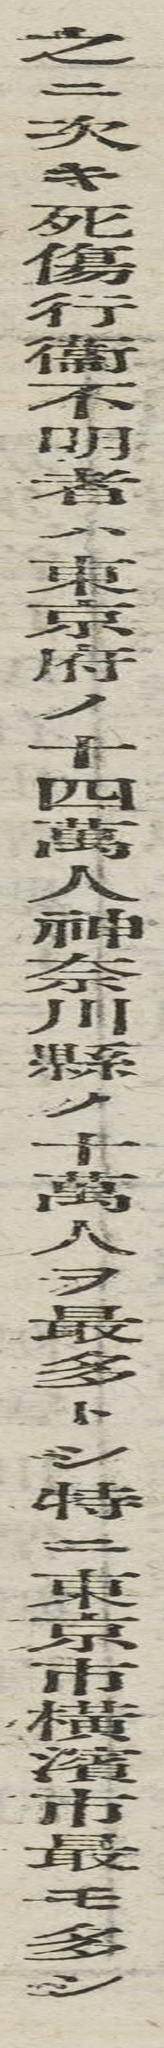之ニ次キ死傷行方不明者ハ東京府ノ十四万人神奈川県ノ十万人ヲ最多トシ特ニ東京市横浜市最モ多シ
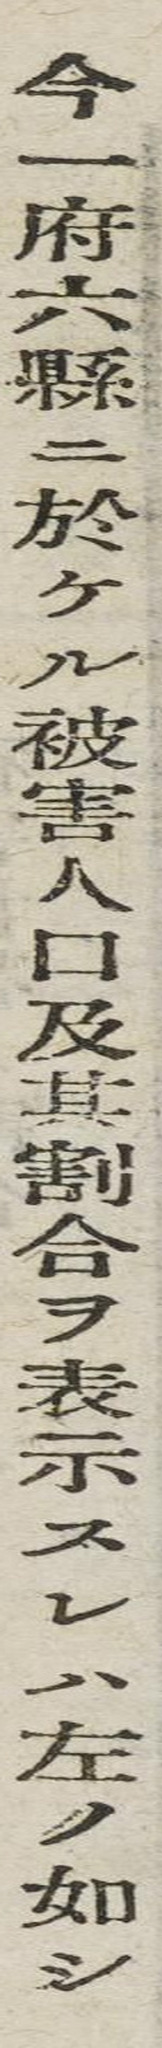今一府六県ニ於ケル被害人口及其割合ヲ表示スレハ左ノ如シ
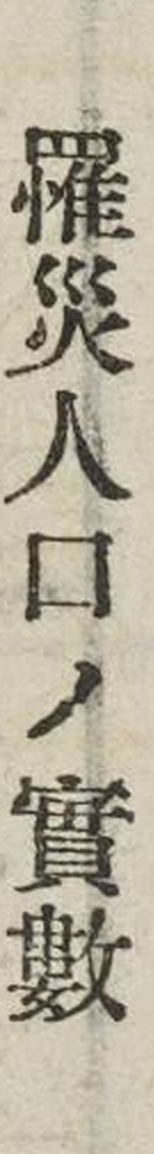罹災人人口ノ実数
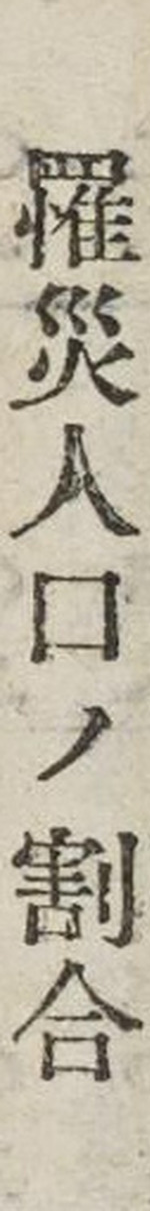罹災人口ノ割合
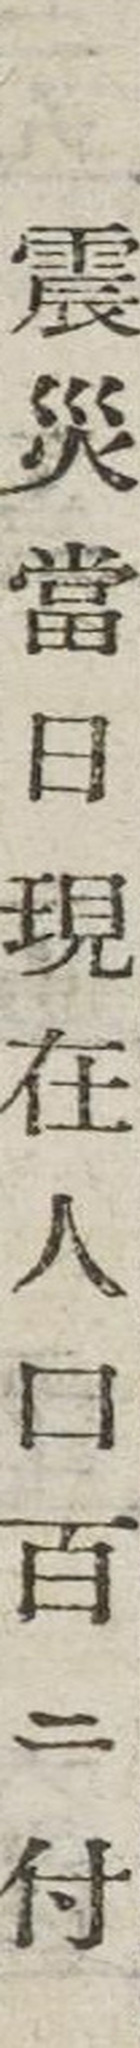震災当日現在人口百ニ付

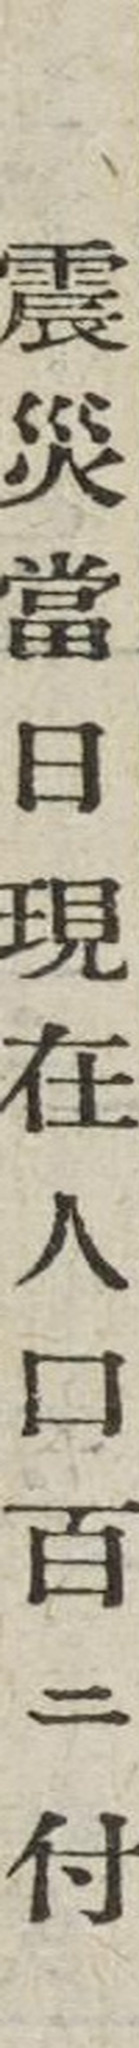震災当日現在人口百ニ付
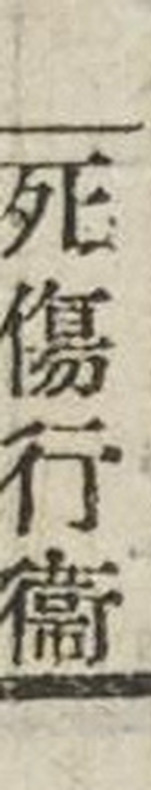死傷行方
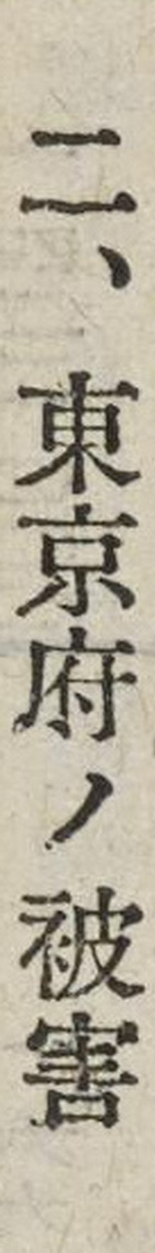ニ、東京府ノ被害世
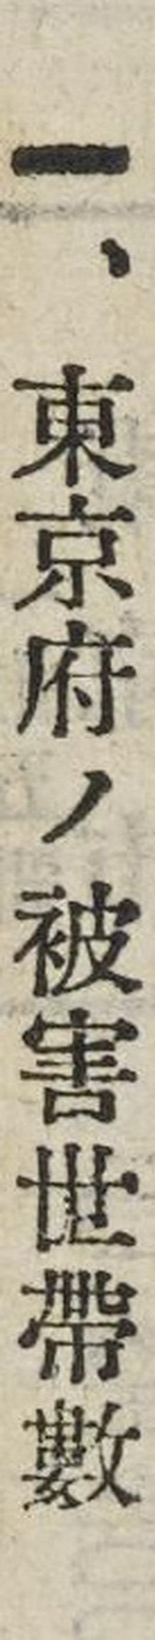一、東京府ノ被害世帯数
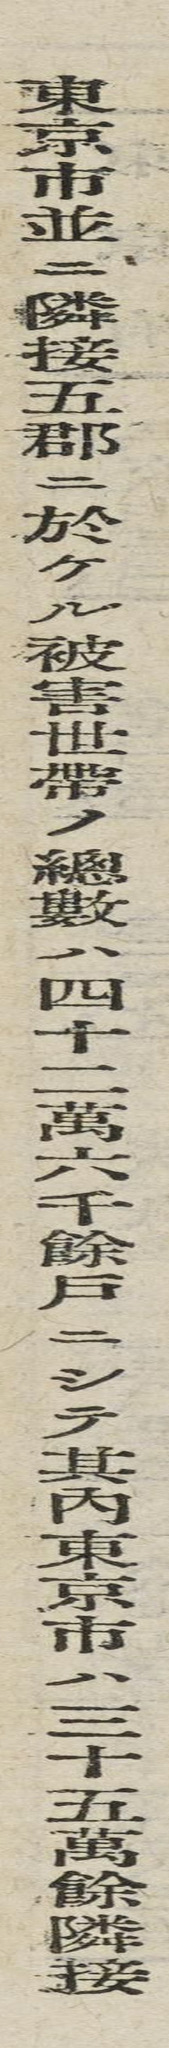東京市並ニ隣接五郡ニ於ケル被害世帯数ノ総数ハ四十二万六千余戸ニシテ其内東京市ハ三十五万余隣接
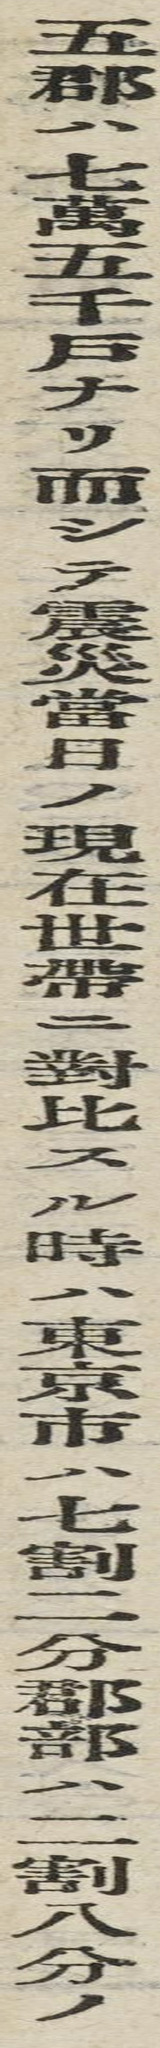五郡ハ七万五千戸ナリ而シテ震災当日ノ現在世帯ニ対比スル時ハ東京市ハ七割二分郡部ハ二割八分ノ
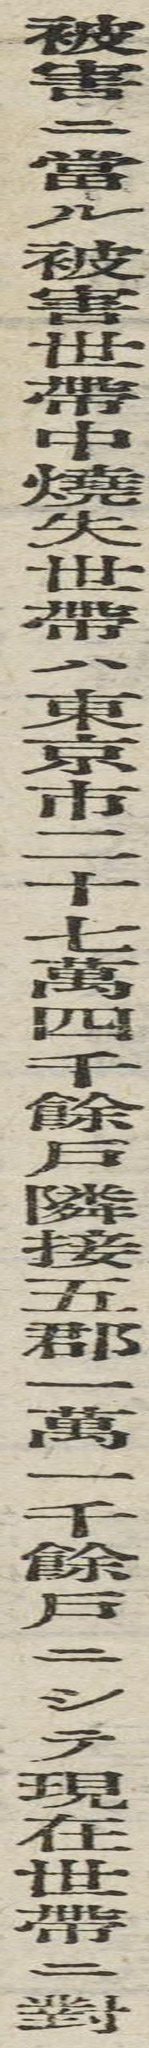被害ニ当ル被害世帯中焼失世帯ハ東京市二十七万四千余戸隣接五郡一万一千余戸ニシテ現在世帯に対
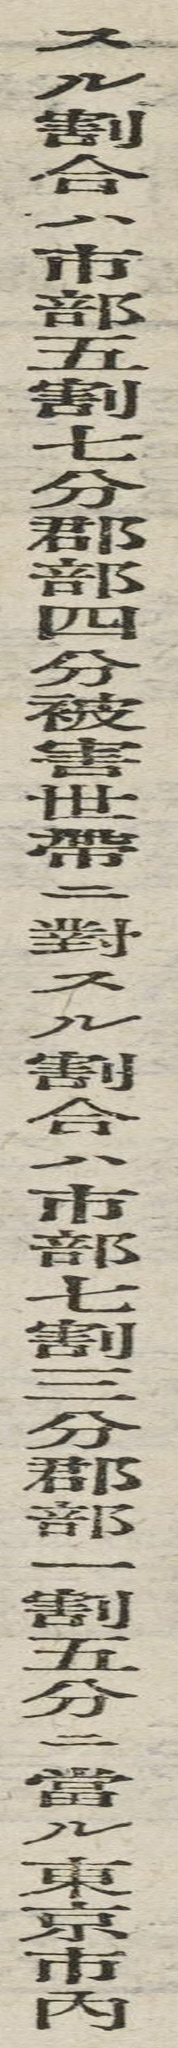スル割合ハ市部五割七分郡部四分被害世帯ニ対スル割合ハ市部七割三分郡部一割五分ニ当ル東京市内
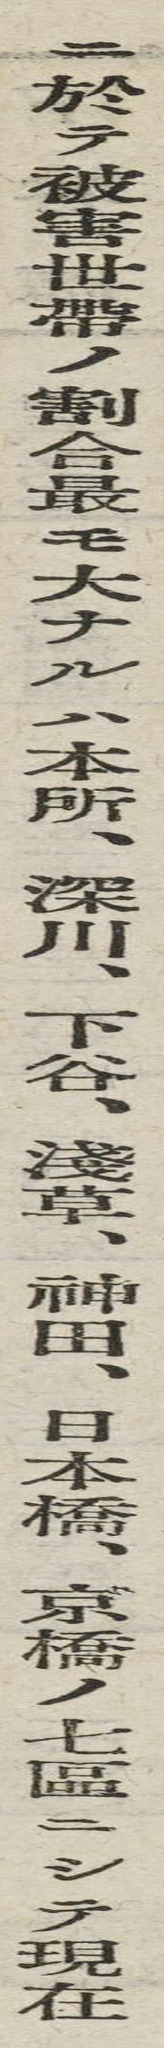ニ於テ被害世帯ノ割合最モ大ナルハ本所、深川、下谷、浅草、神田、日本橋、京橋ノ七区ニシテ現在
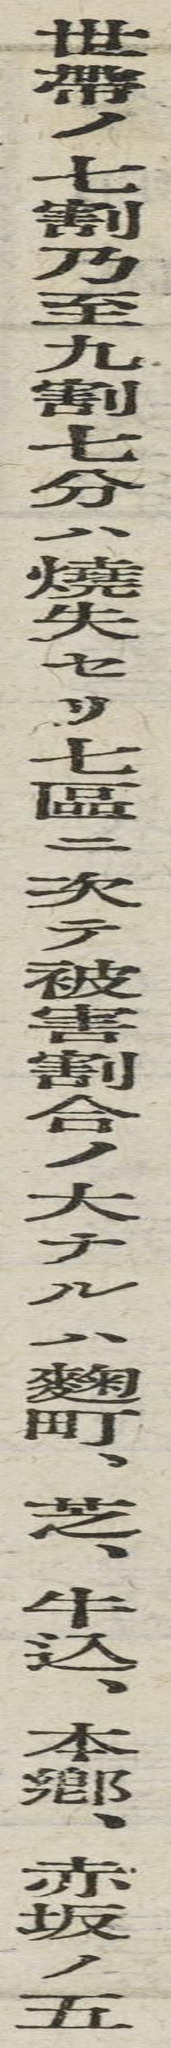世帯ノ七割乃至九割七分ハ焼失セリ七区ニ次テ被害割合ノ大ナルハ麹町、芝、牛込、本郷、赤坂ノ五
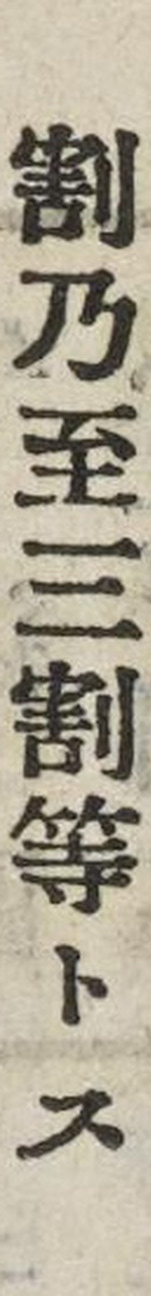割乃至三割等トス
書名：震災被害状況並救護施設概要
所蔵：東京大学地震研究所図書室 Earthquake Research Institute Library, The University of Tokyo, JAPAN
